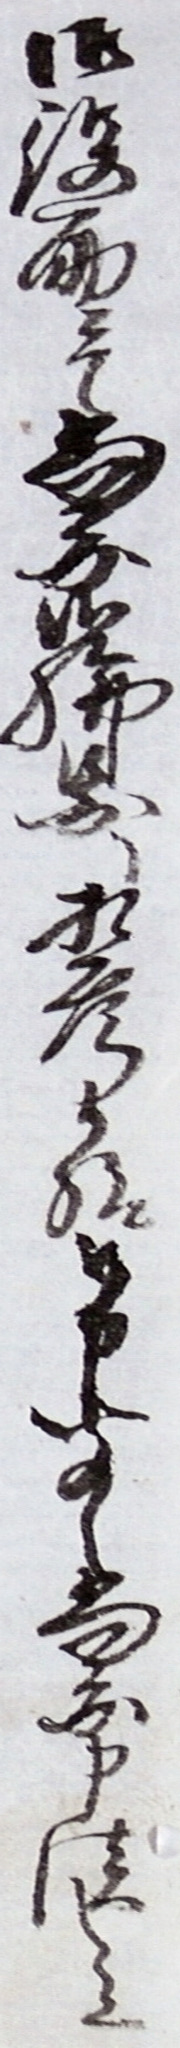御役筋ニて尚亦御払図り相考候様被申聞候尚亦申談之上
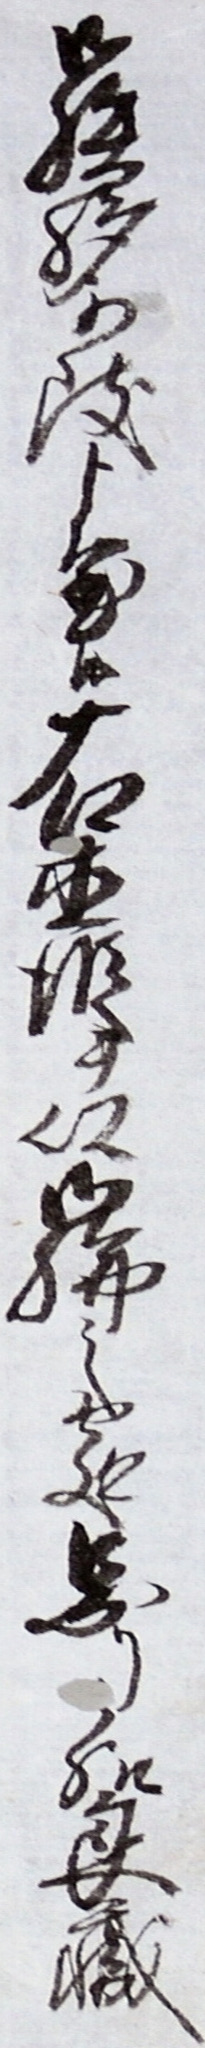御挨拶可致申置候右直段ヲ以御払之処図り様良蔵
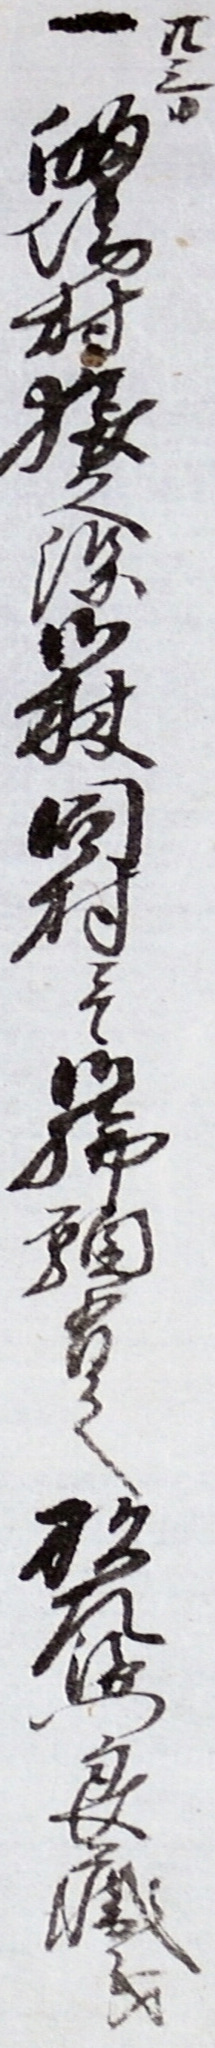一的場村久添御林同村ニて御払願有之杉左衛門良蔵義
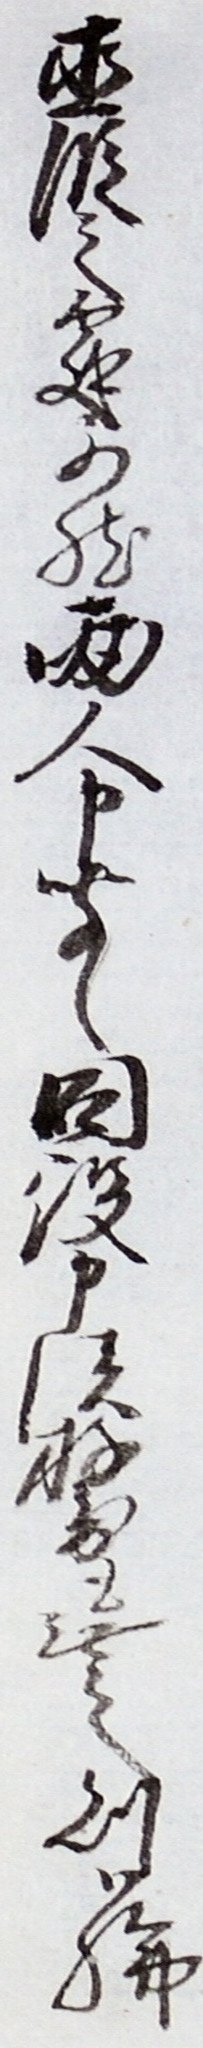直段之処可然両人申聞候同役申談も無之則御払
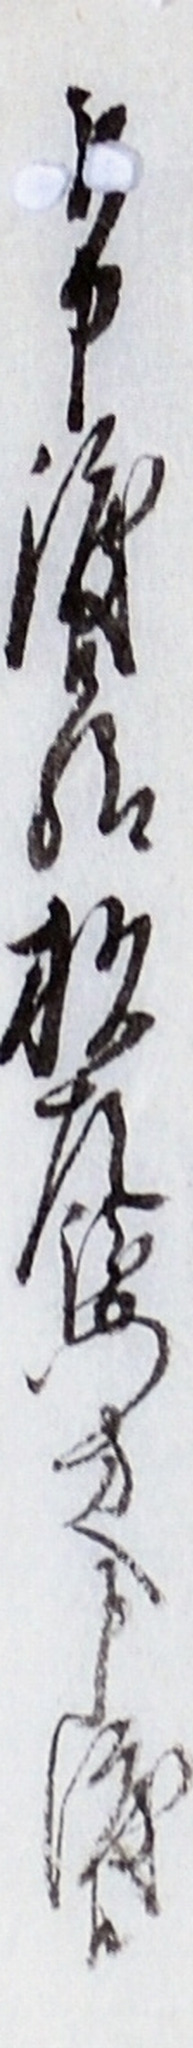被申渡候様杉左衛門方へ申渡候
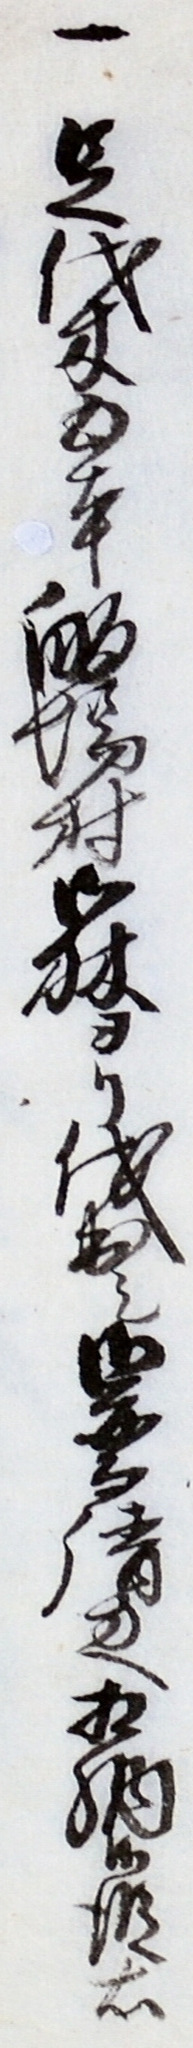一足伐木五本的場村御林ヨリ伐出し御普請方へ相納候段は
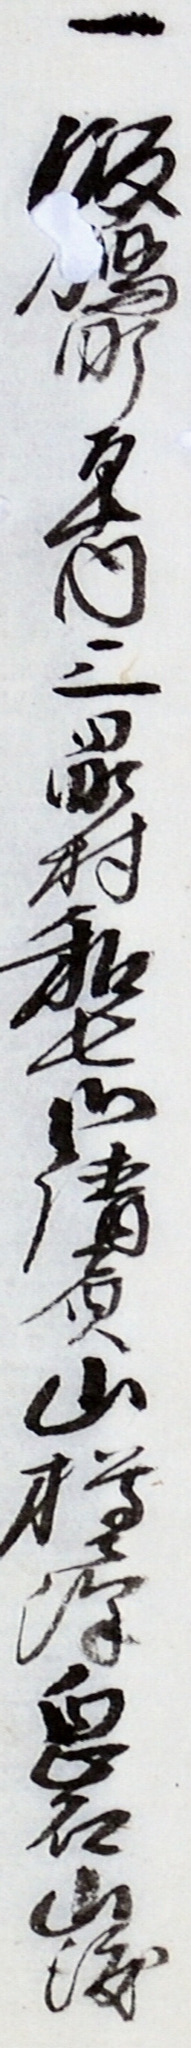一飯嶋町家内三日町村和七御請負山権之沢白岩山渡
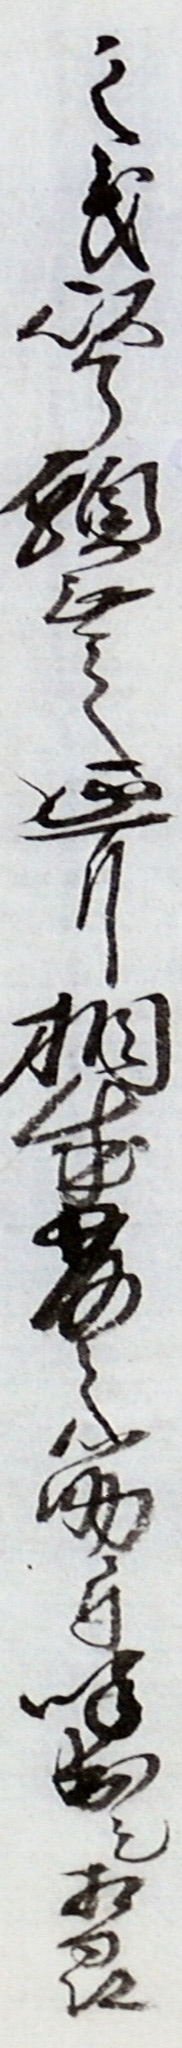之義以今願無之廻引相成之筋ニ付呼出し相尋
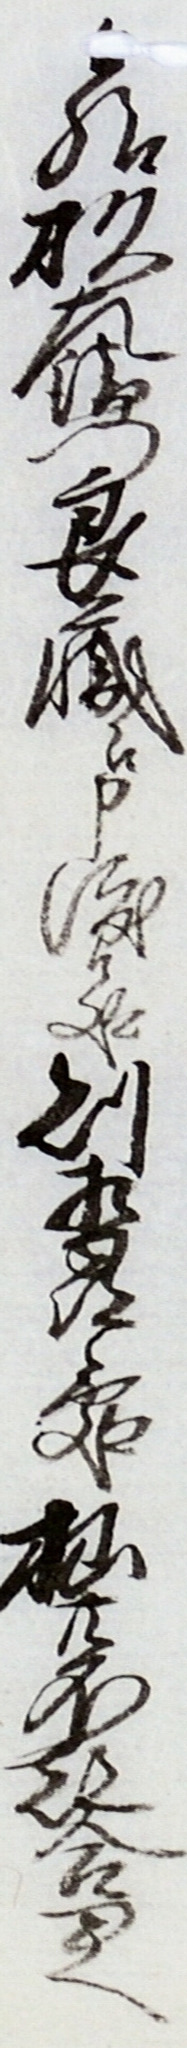候様杉右衛門良蔵江申渡候処則相替之処杣共不都合へ
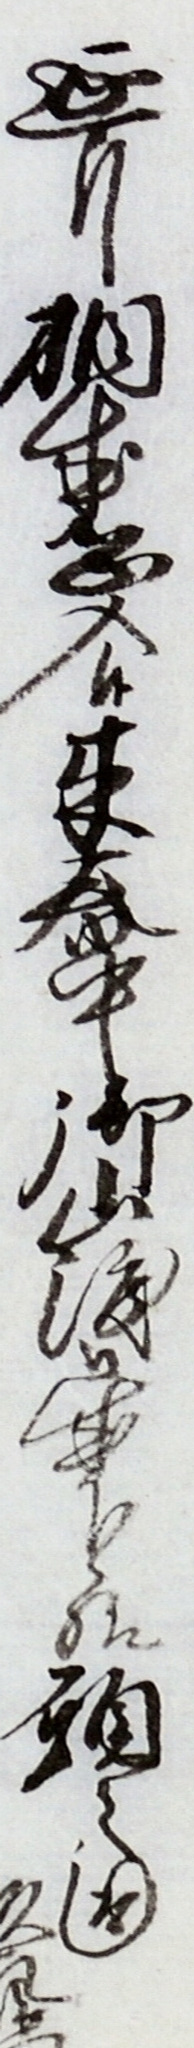廻引納成恐入候春中御山渡候成下候様願之趣
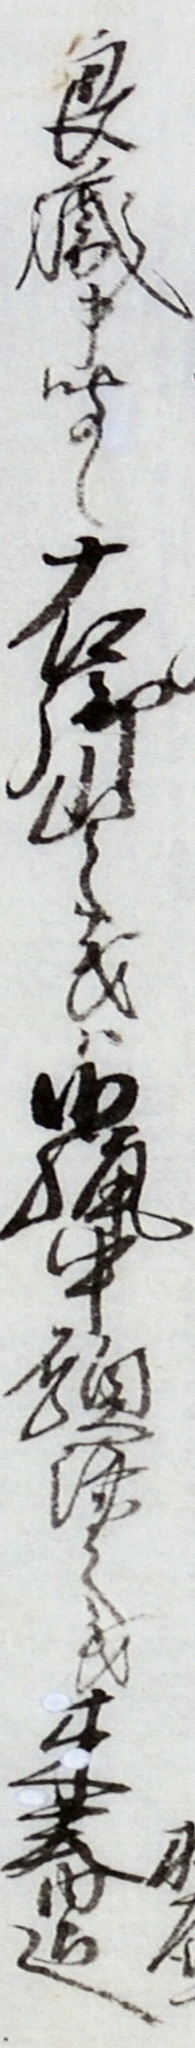良蔵申聞候右御山之義ハ御領中願済之義来春由迄
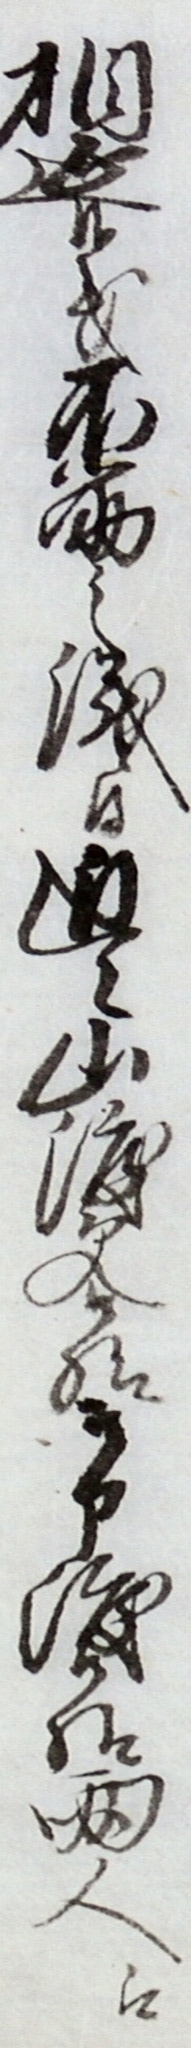相候義不筋之儀ニ付追々山渡受候様被申渡候様両人江
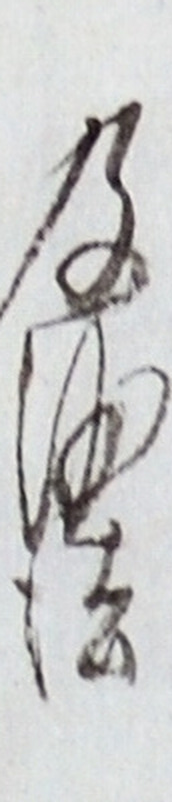及沙汰
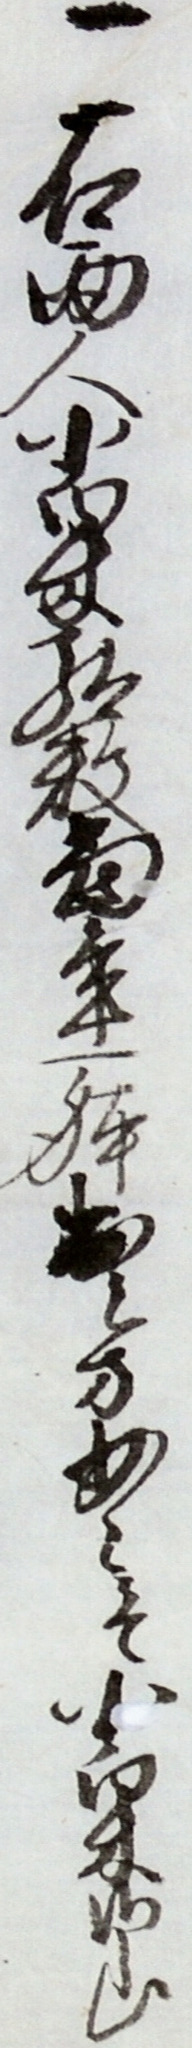一右両人小白木駄数当年一躰出し方少々ニて小白木御山
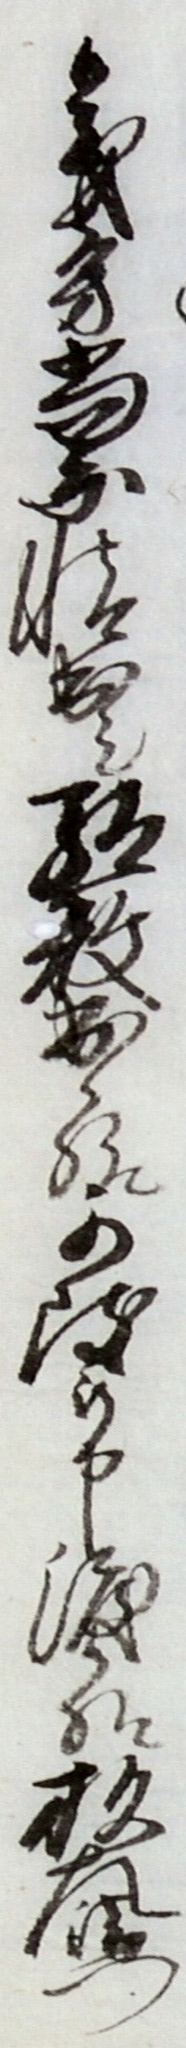候義方当分請出し駄数出候様可致被申渡候様杉左衛門

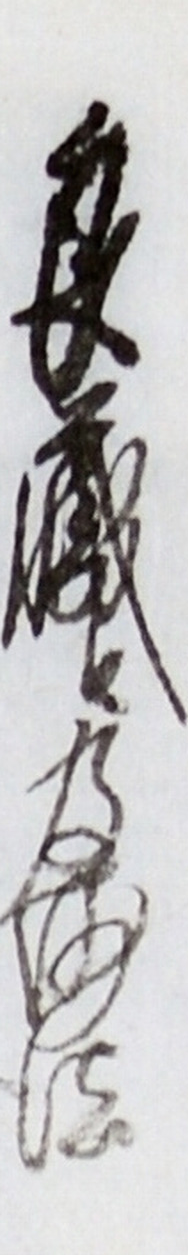良蔵江及沙汰
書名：御山奉行御用控
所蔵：伊那市立高遠町図書館・合同会社AMANE
